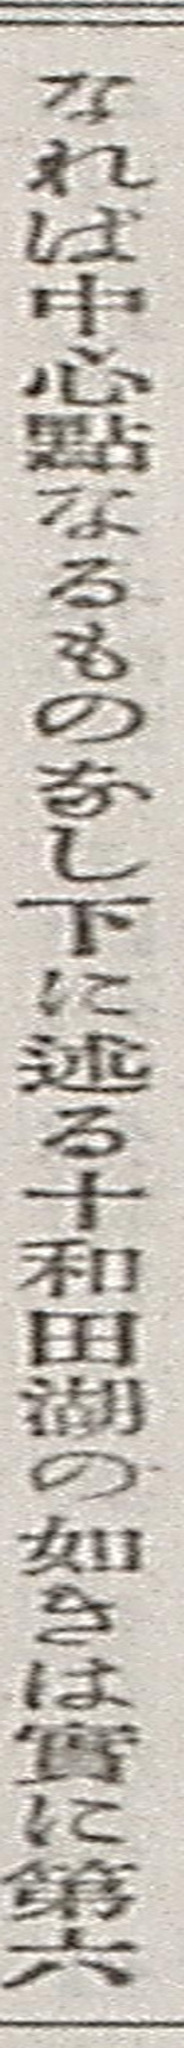なれば中心点なるものなし下に述る十和田湖の如きは実に第六
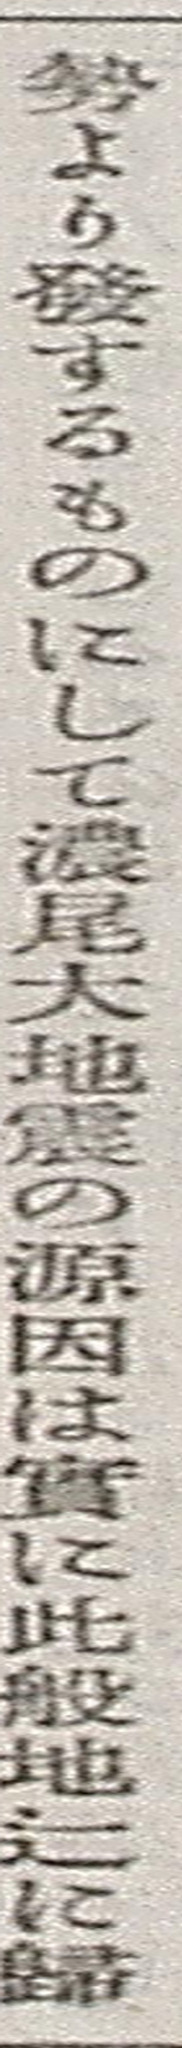勢より発するものにして濃尾大地震の源因は実に此般地辷に帰
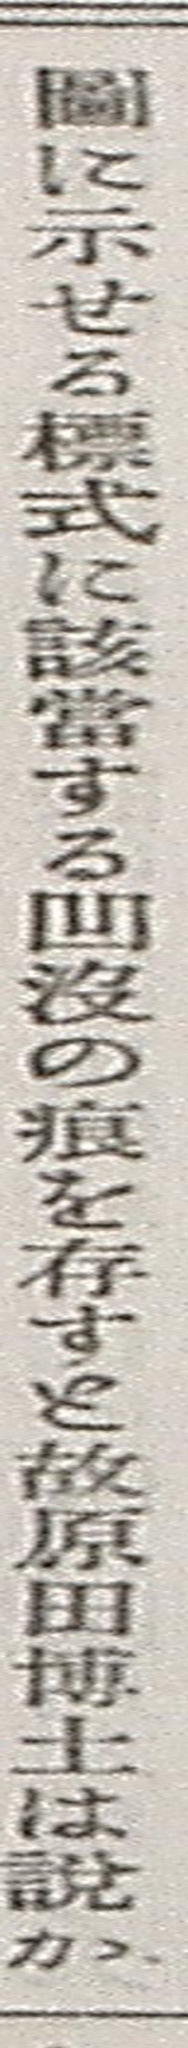図に示せる標式に該当する凹没の痕を存すと故原田博士は説か
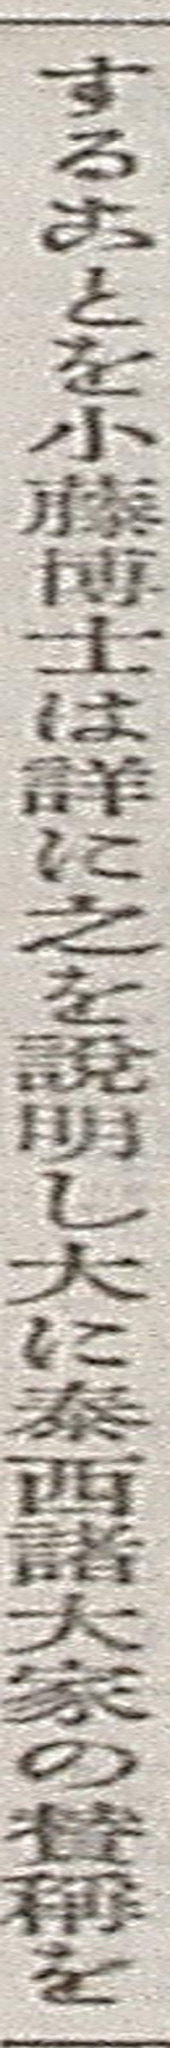することを小藤博士は詳に之を説明し大に泰西諸大家の賛称を
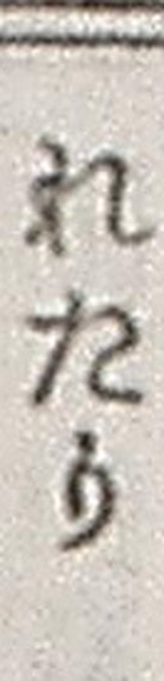れたり
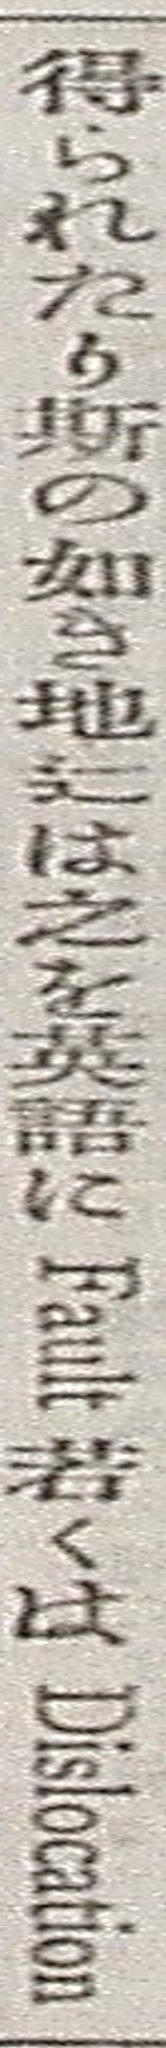得られたり斯の如き地辷は之を英語に若くは
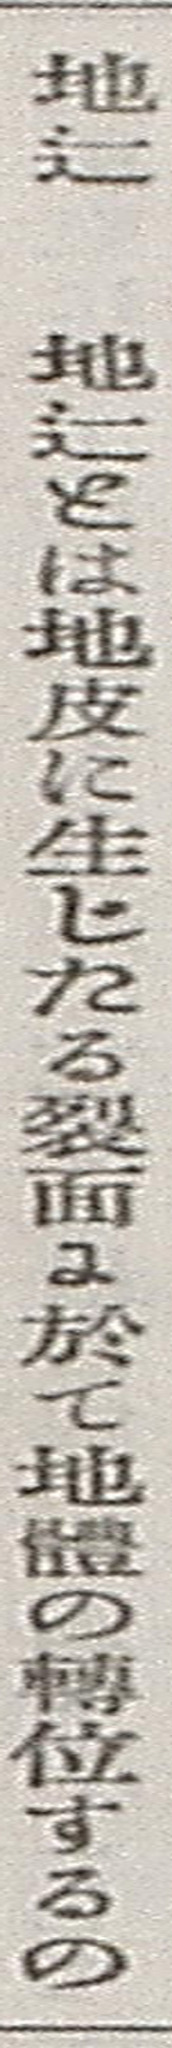地辷地辷とは地皮に生じたる裂面に於て地体の転位するの
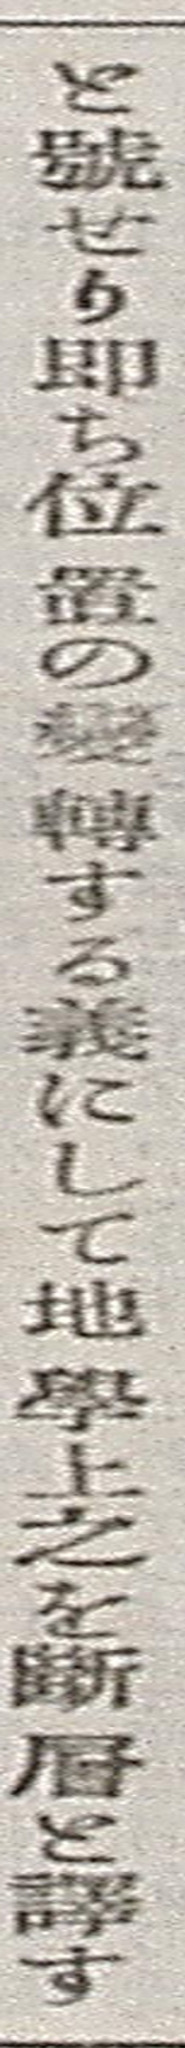と号せり即ち位置の変転する義にして地学上之を断層と訳す
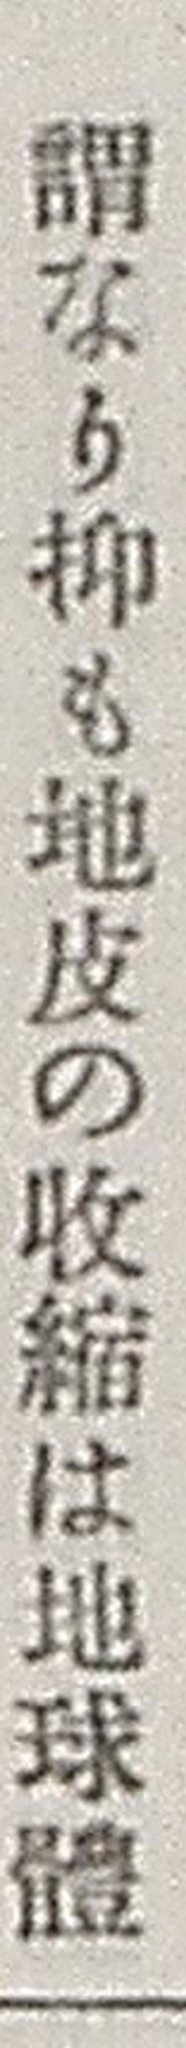謂なり抑も地皮の収縮は地球体
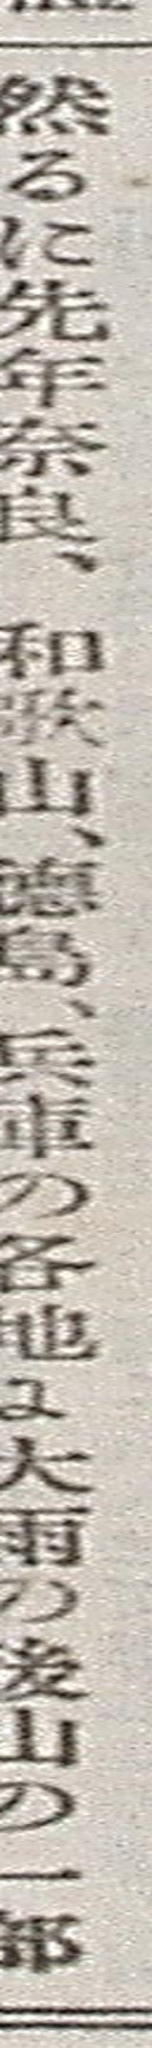然るに先年奈良、和歌山、徳島、兵庫の各地に大雨の後山の一部
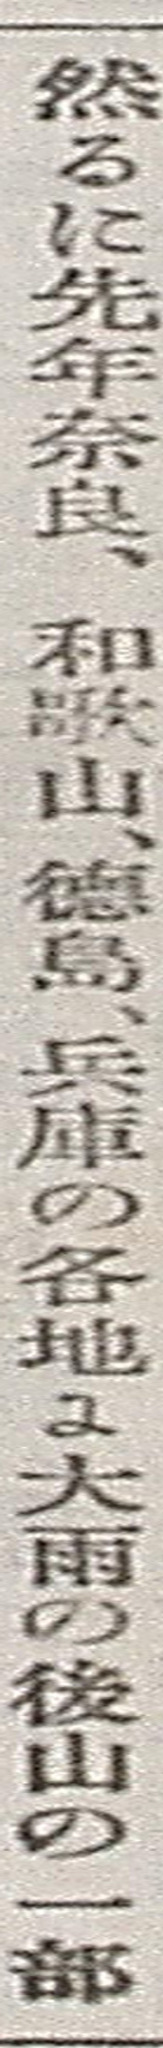然るに先年奈良、和歌山、徳島、兵庫の各地に大雨の後山の一部
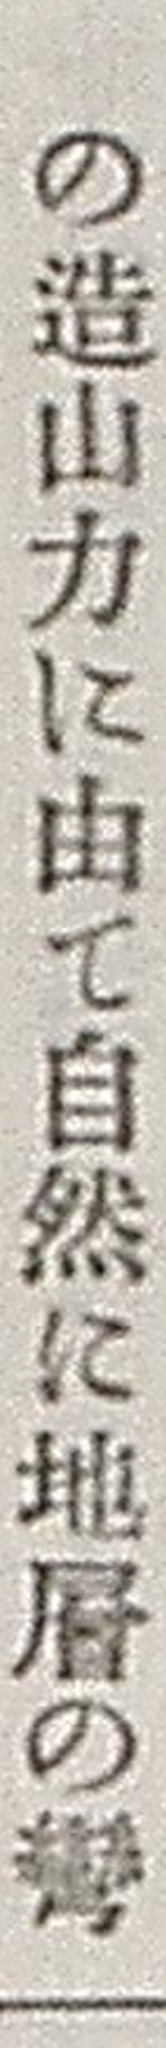の造山力に由て自然に地層の湾
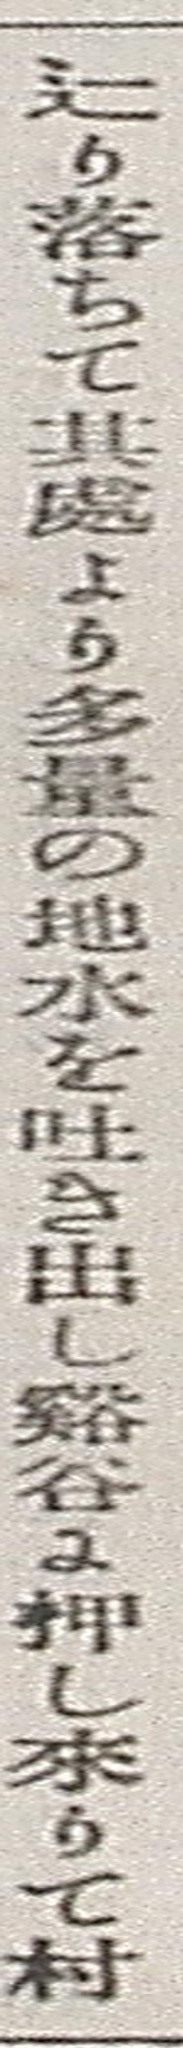辷り落ちて其処より多量の地水を吐き出し谿谷に押し来りて村
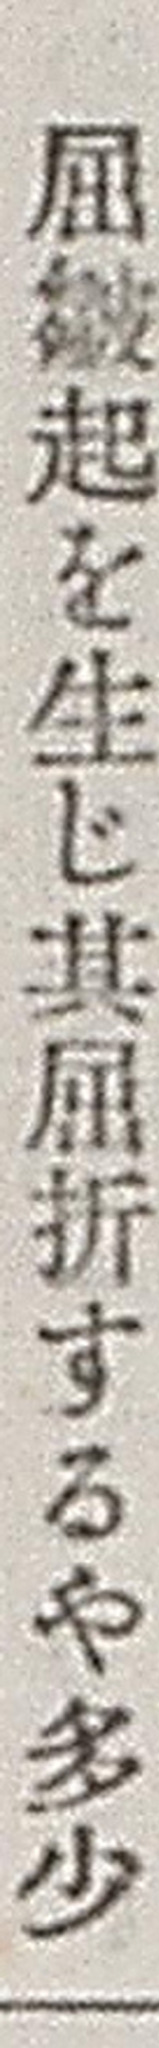屈皺起を生じ其屈折するや多少
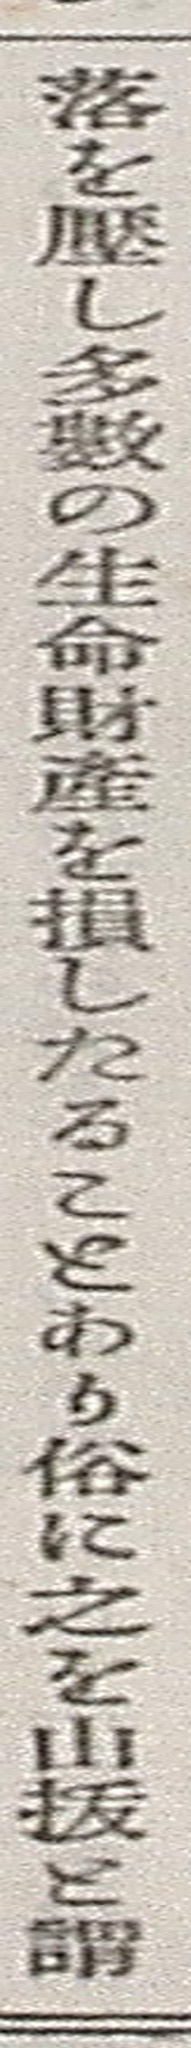落を圧し多数の生命財産を損したることあり俗に之を山抜と謂
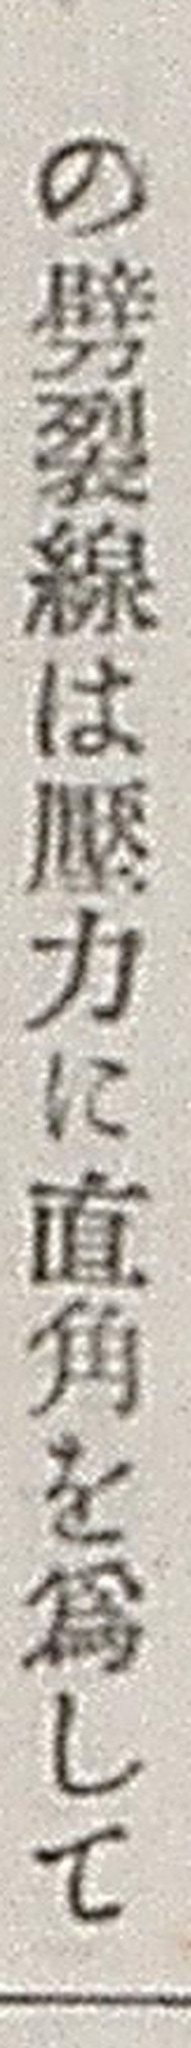の劈裂線は圧力に直角を為して
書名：風俗畫報臨時増刊第百二十號　大海嘯被害録（下）
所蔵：東京大学地震研究所図書室 Earthquake Research Institute Library, The University of Tokyo, JAPAN
